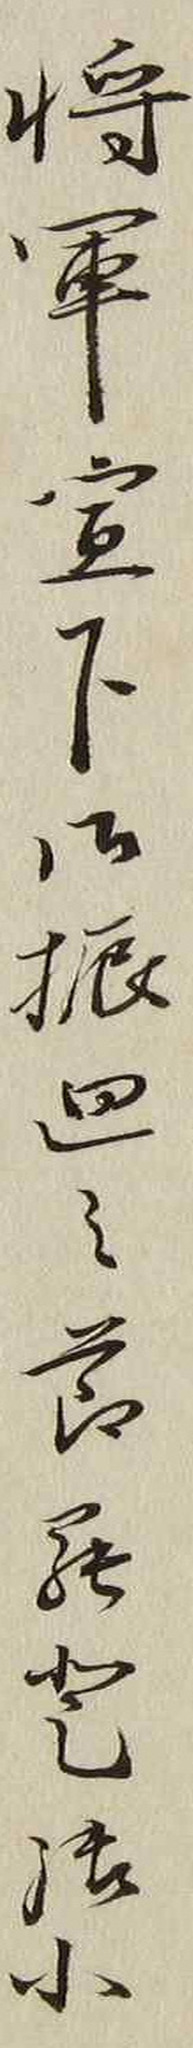将軍宣下御振廻之節罷登御小
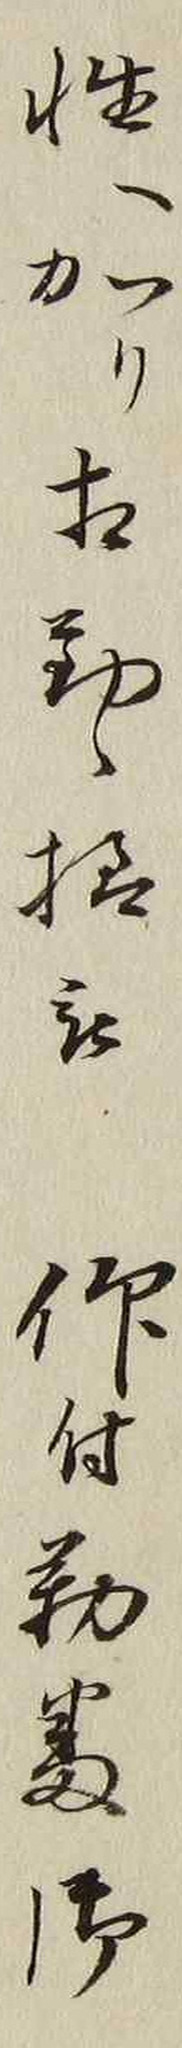性へ加り相勤候様被仰付勤番御
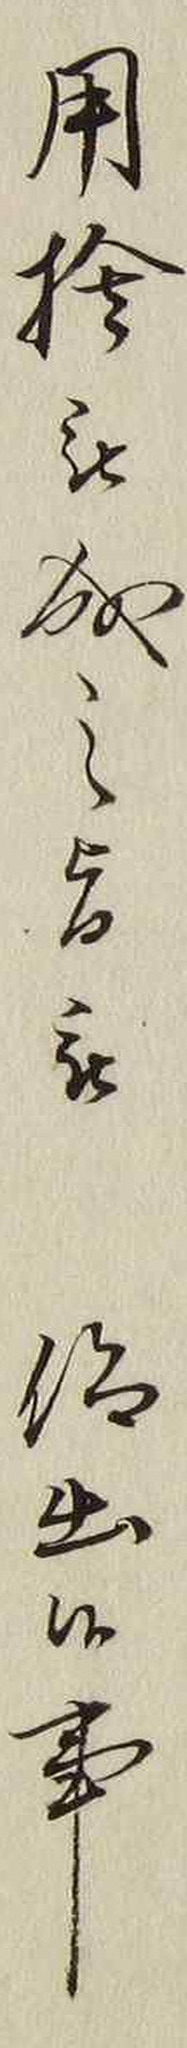用捨被成之旨被仰出候事
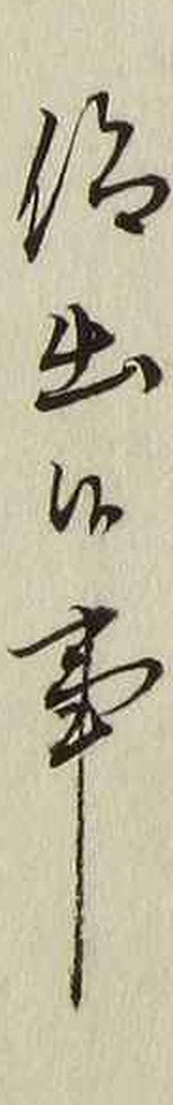仰付候事
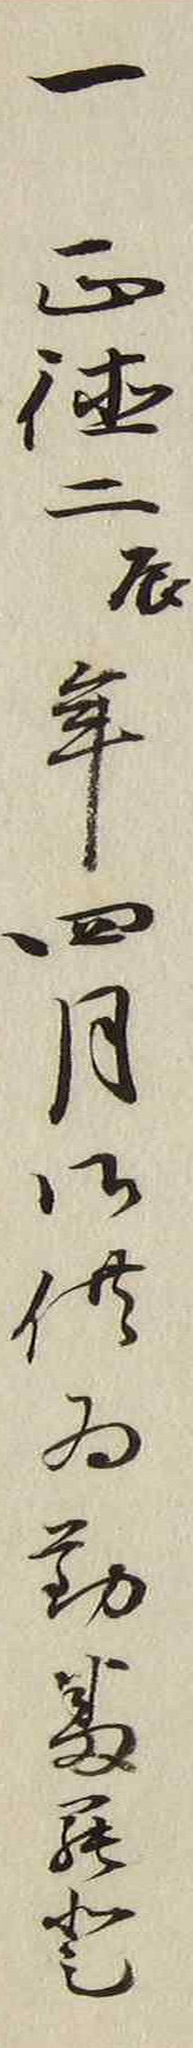一正徳二辰年四月御供為勤番罷登
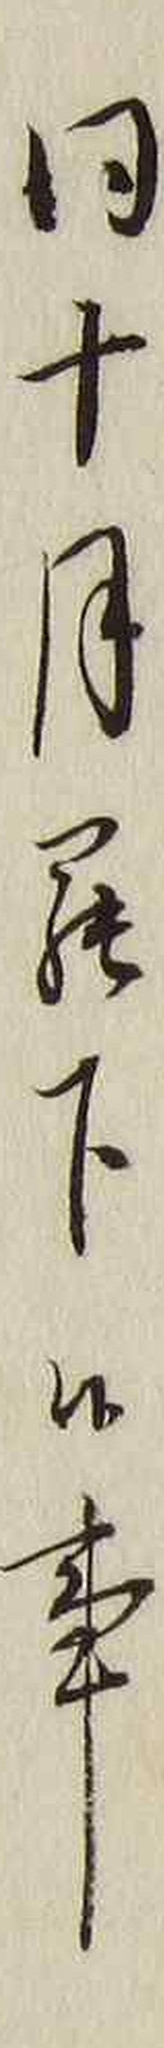同十月罷下候事
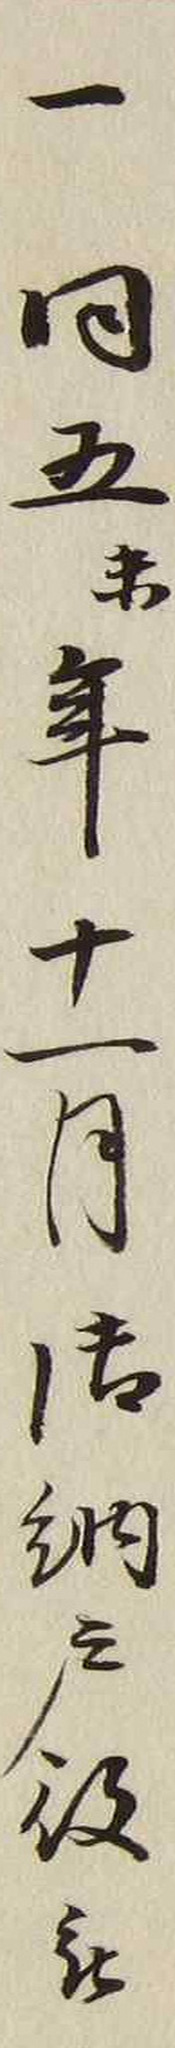一同五未年十一月御納戸役被
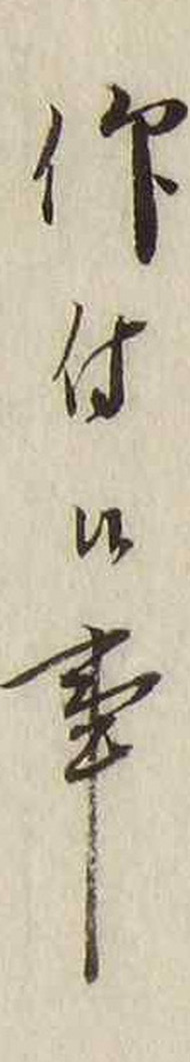仰付候事

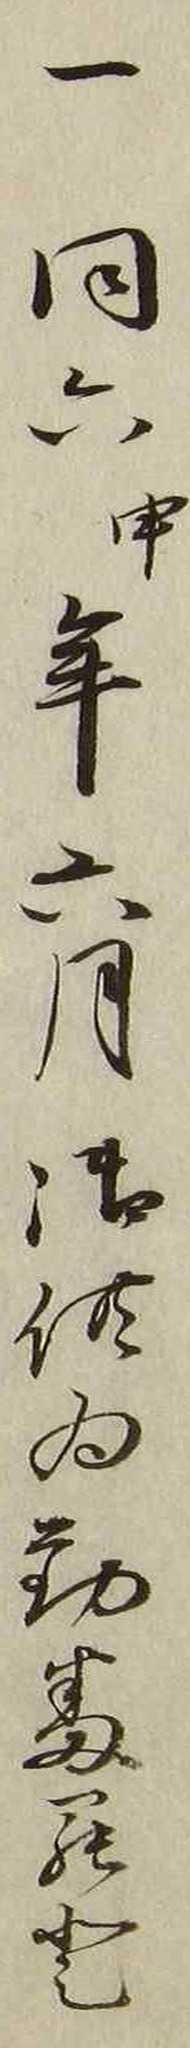一同六申年六月御供為勤番罷登
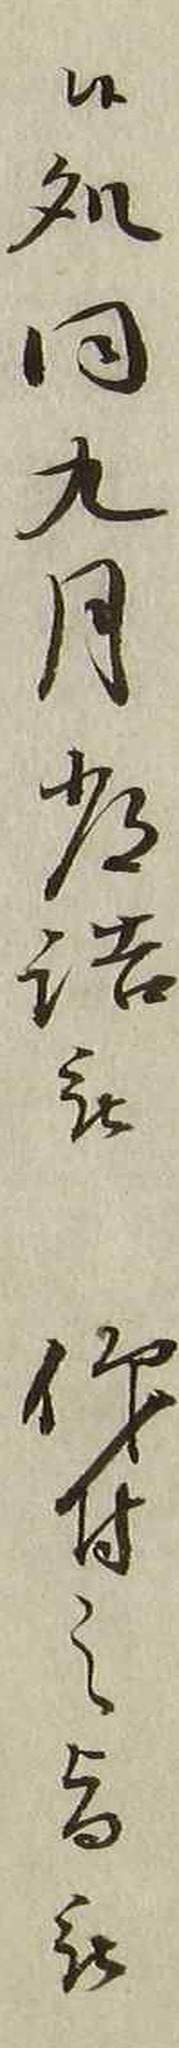候処同九月常詰被仰付之旨被
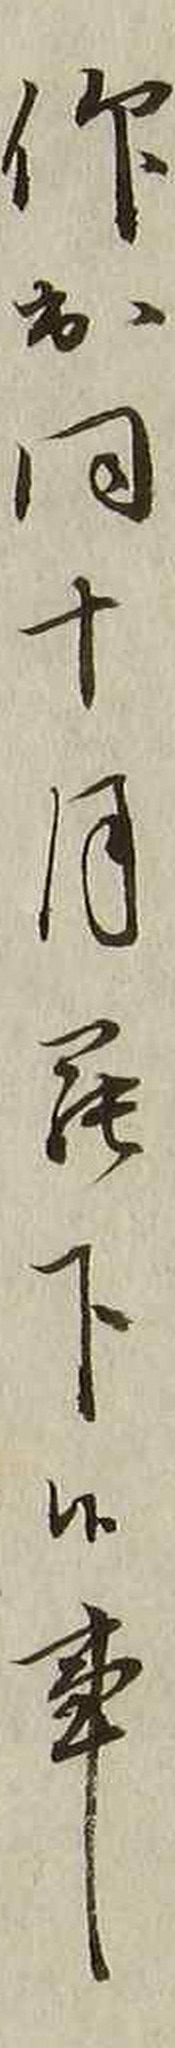仰出同十月罷下候事
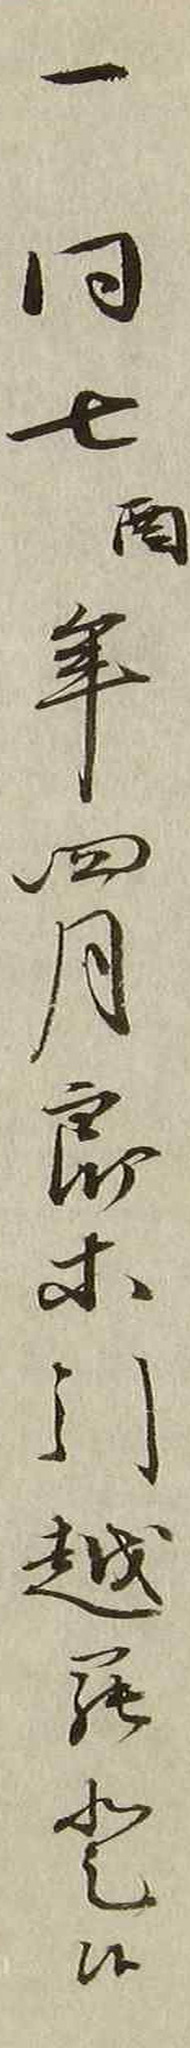一同七酉年四月郎等引越罷登候
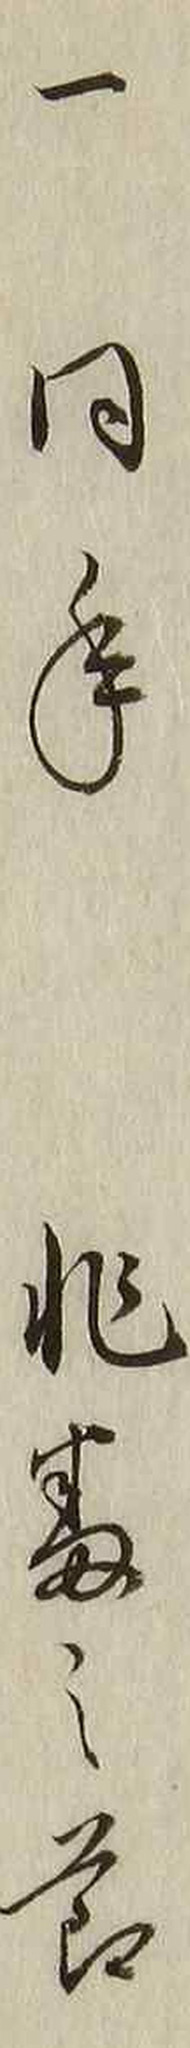一同年非番之節
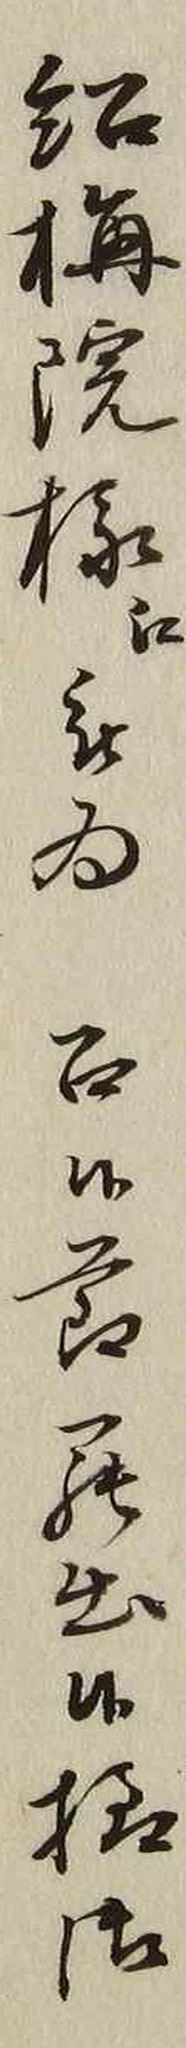紹栴院様江被為召候節罷出候様御
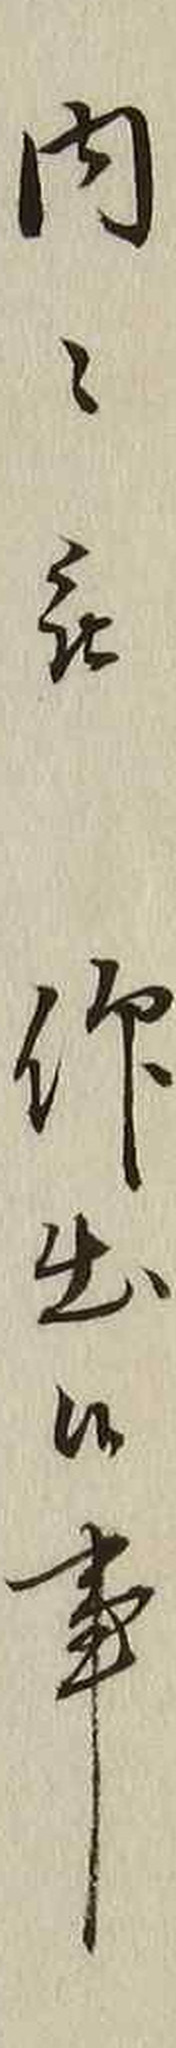内々被仰出候事
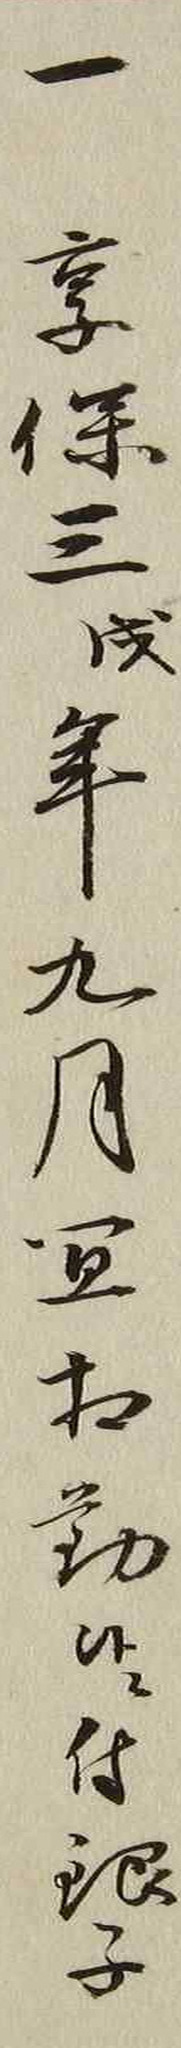一享保三戌年九月宜相勤候ニ付銀子
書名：諸士系譜　巻之22　い之部22
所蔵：会津若松市立会津図書館
